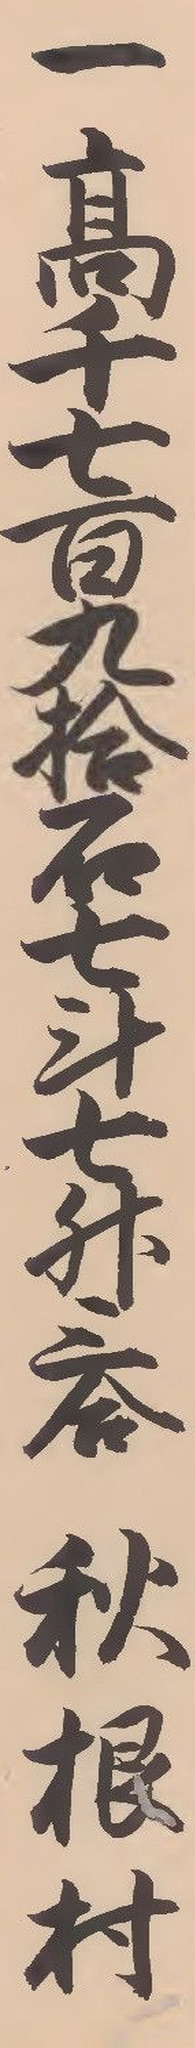一高千七百九拾石七斗七升三合秋根村
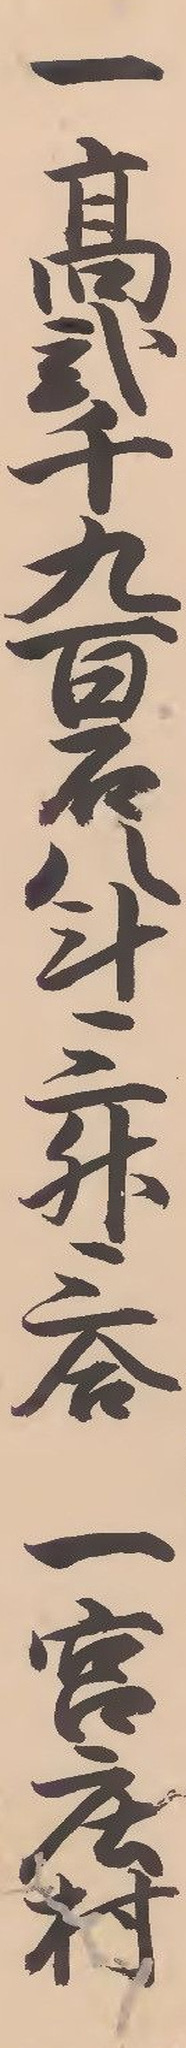一高弐千九百石八斗三升三合一宮庄村

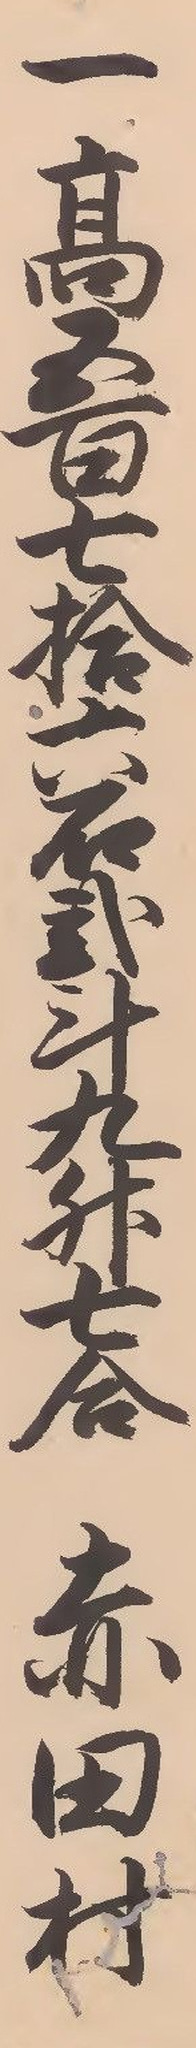一高五百七拾六石弐斗九升七合赤田村
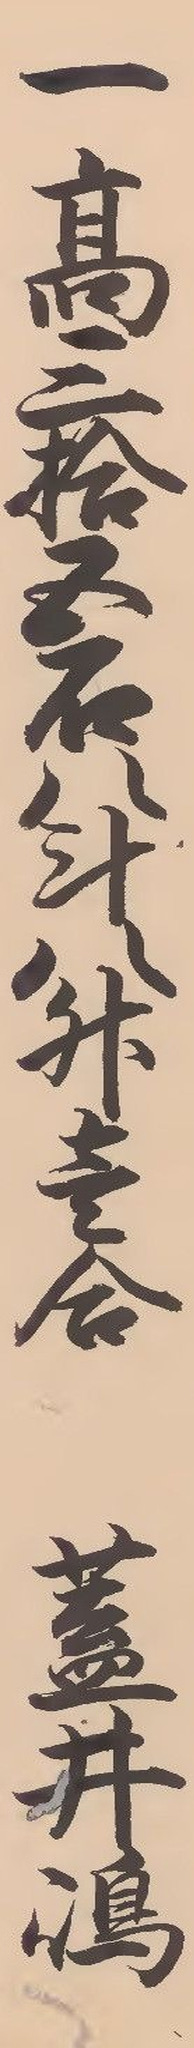一高三拾五石八斗八升壱合蓋井嶋
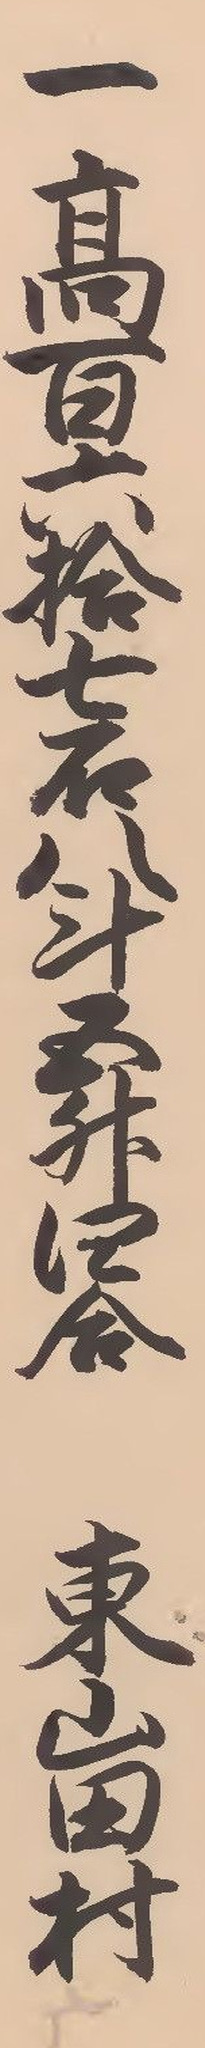一高百六拾七石八斗五升四合東山田村
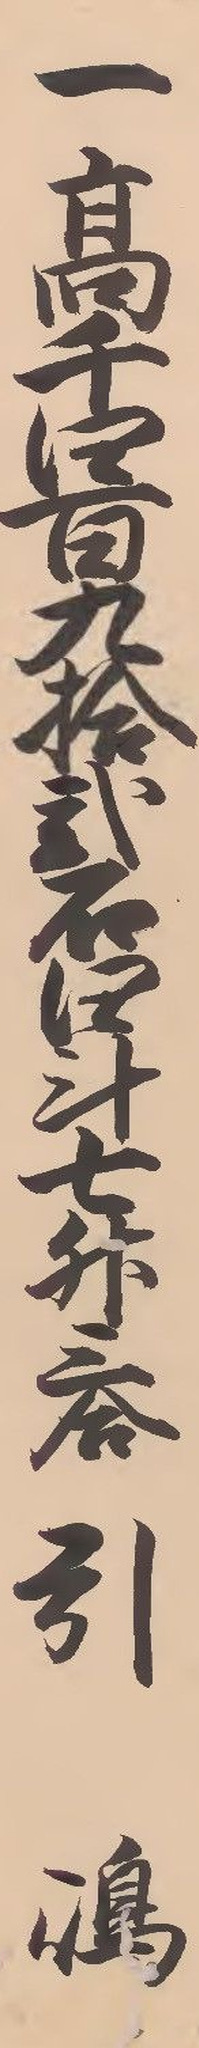一高千四百九拾弐石四斗七升三合引嶋
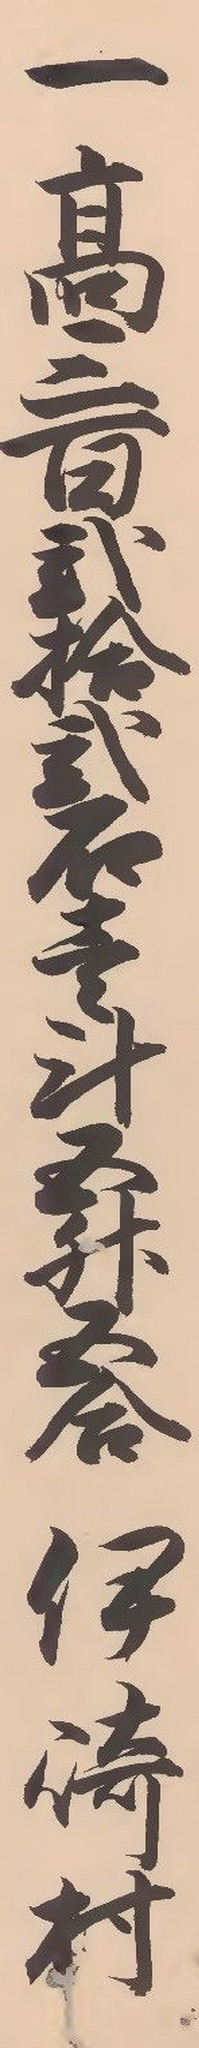一高三百弐拾弐石壱斗五升五合伊崎村
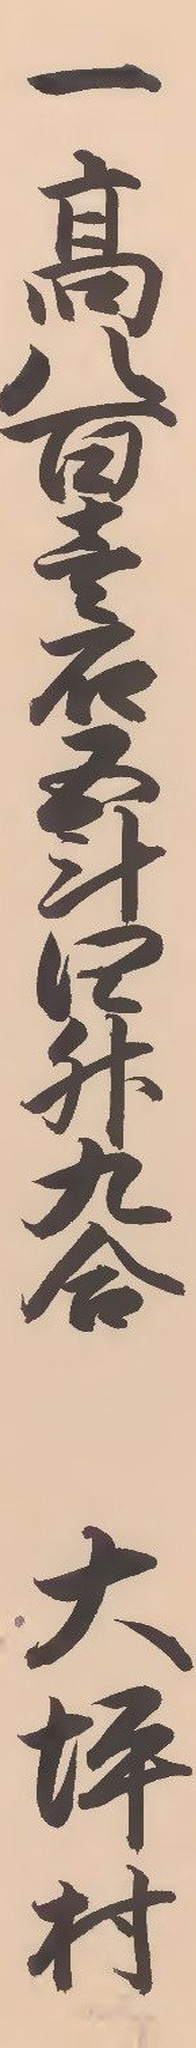一高八百壱石五斗四升九合大坪村
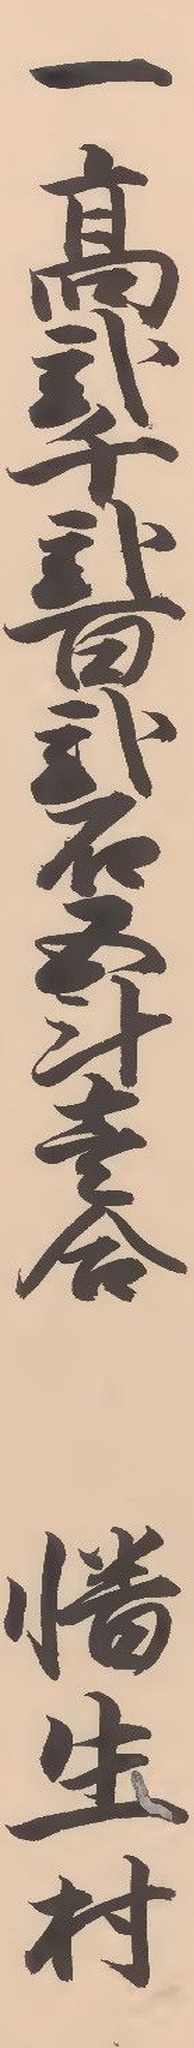一高弐千弐百弐石五斗壱合幡生村
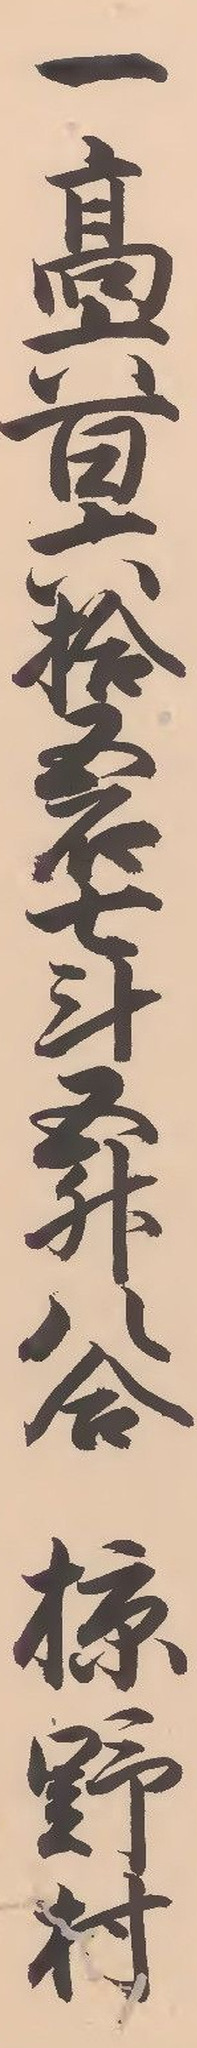一高六百六拾五石七斗五升八合椋野村

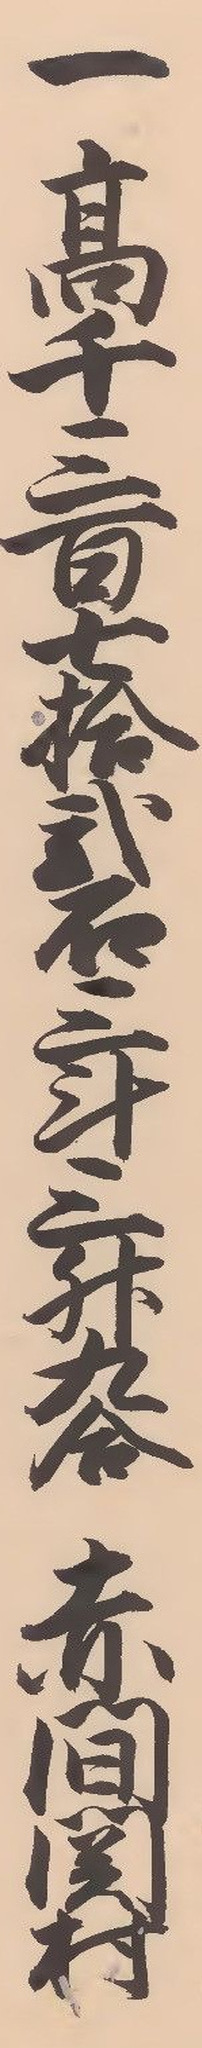一高千三百七拾弐石三斗三升九合赤間関村
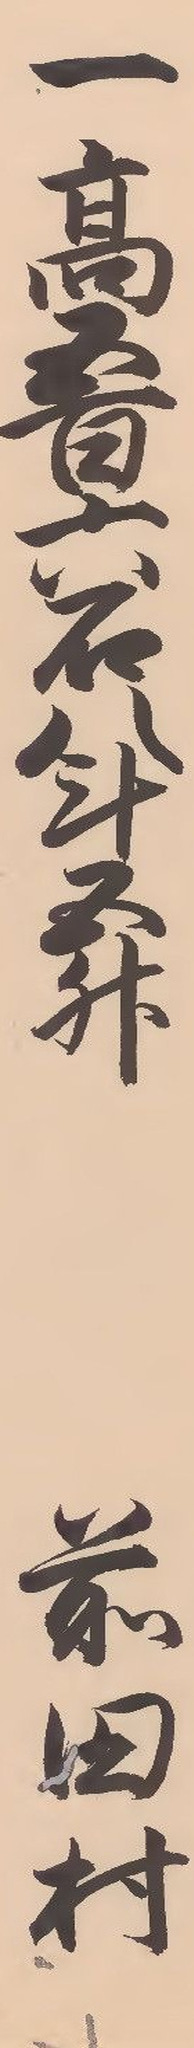一高五百六石八斗五升前田村
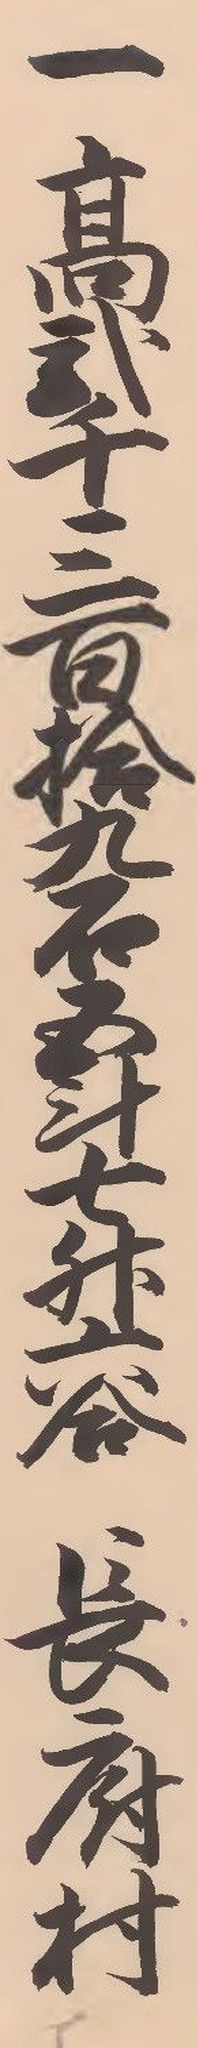一高弐千三百拾九石五斗七升六合長府村
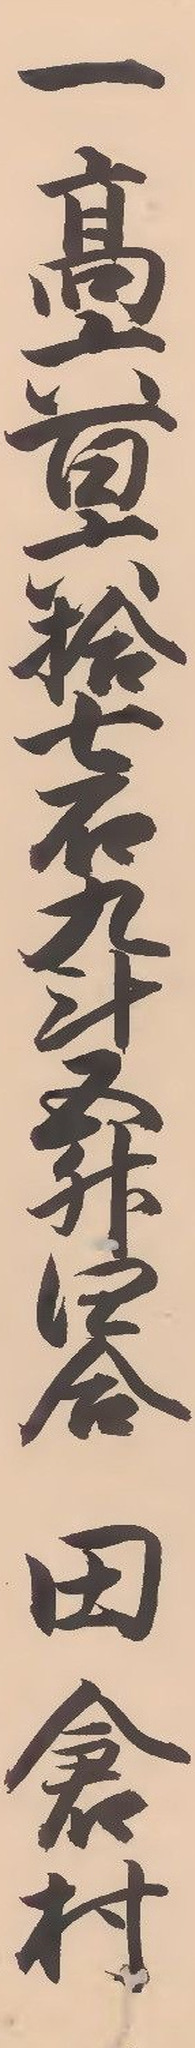一高六百六拾七石九斗五升四合田倉村
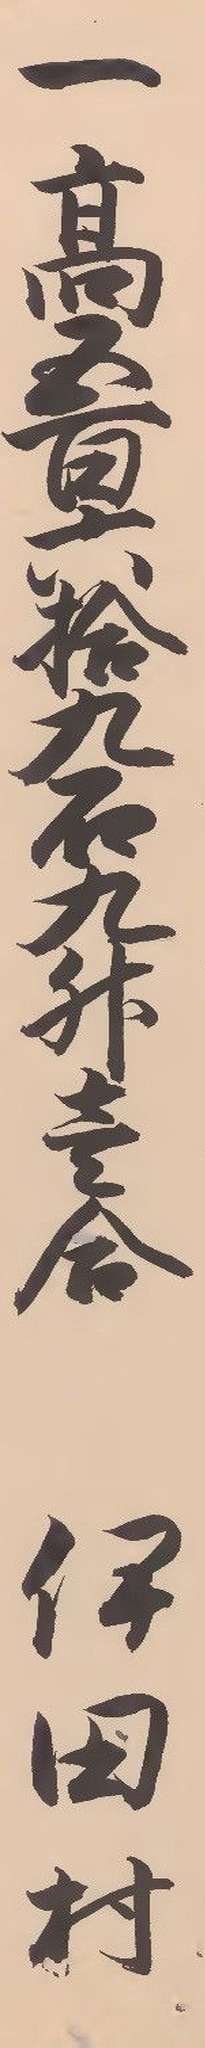一高五百六拾九石九升壱合伊田村
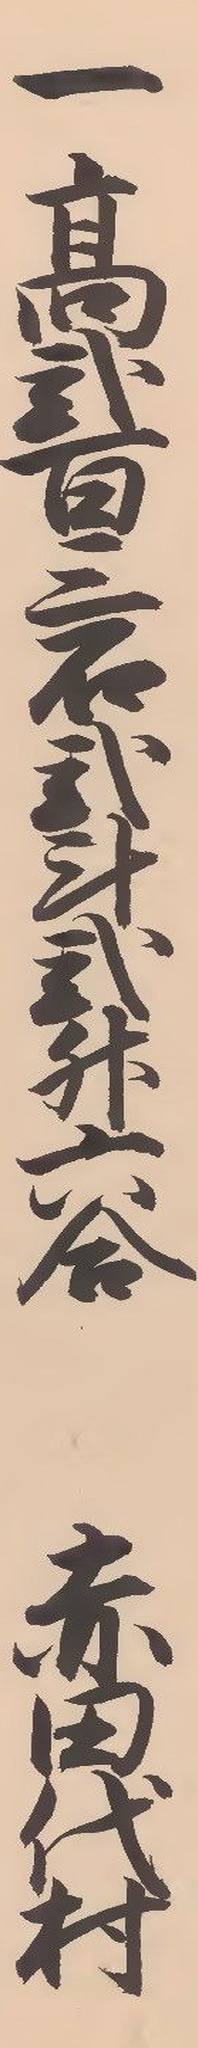一高弐百三石弐斗弐升六合赤田代村
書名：長門国郷帳
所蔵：国立公文書館 National Archives of Japan
